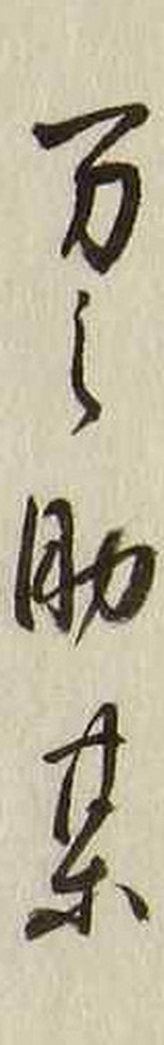万之助某
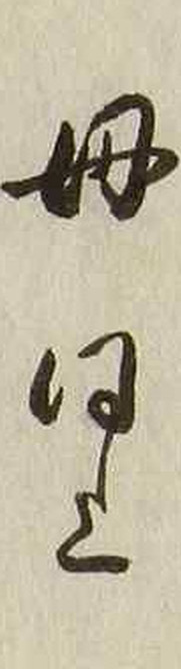母同上
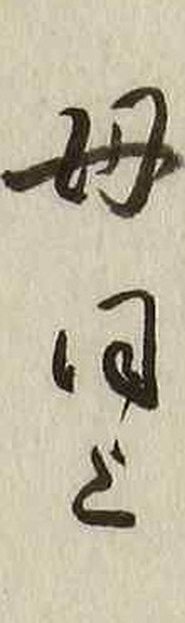母同上
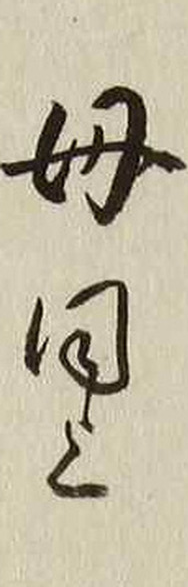母同上
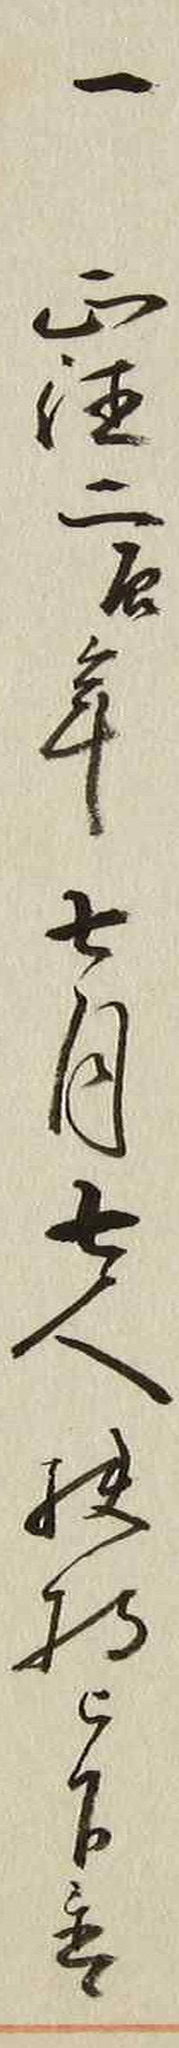一正徳二辰年七月七人扶知被下置候
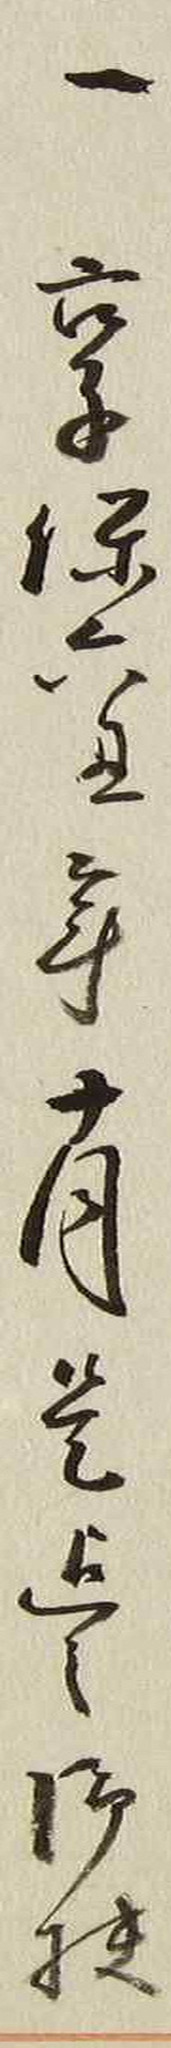一享保六丑年十月是迄之御扶
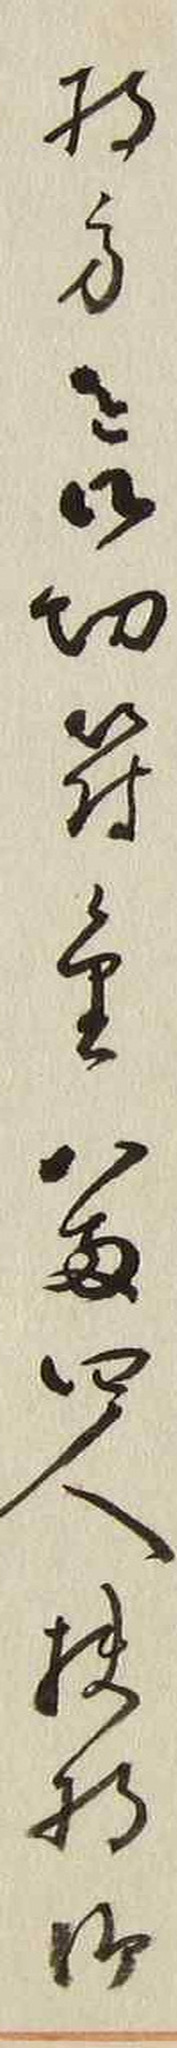持知方を御切符金八両四人扶持御
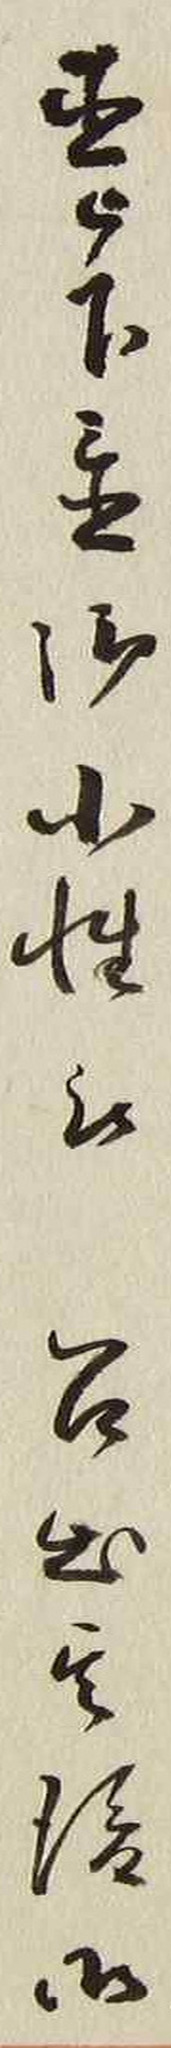直被下置御小姓被召出其後御
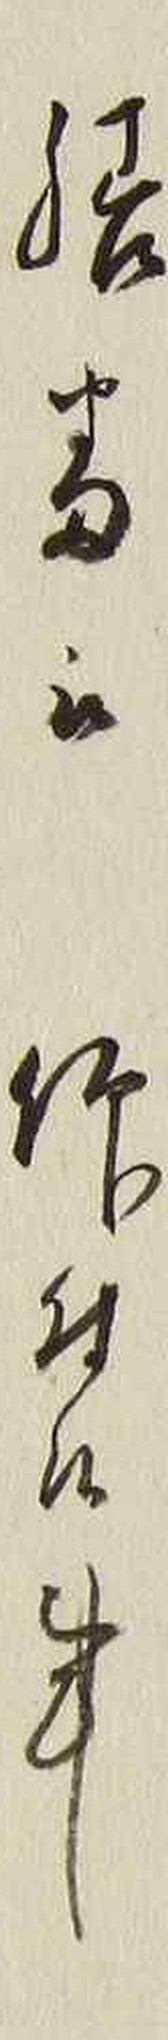膳番被仰付候事
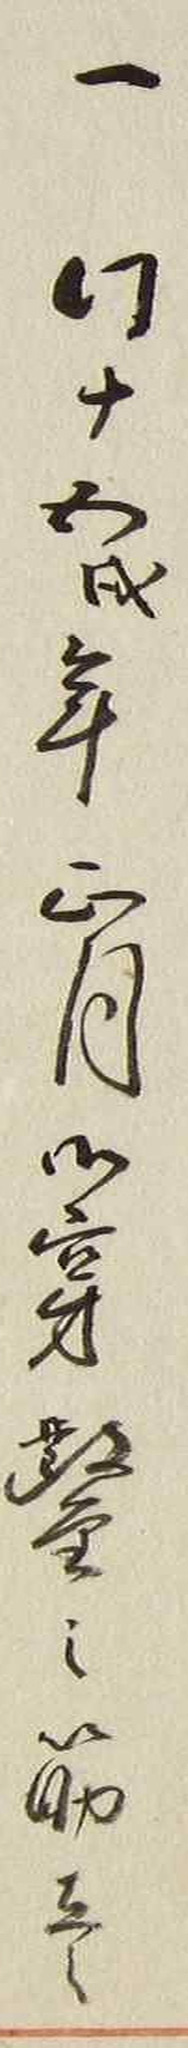一同十五戌年正月御穿鑿之筋有之
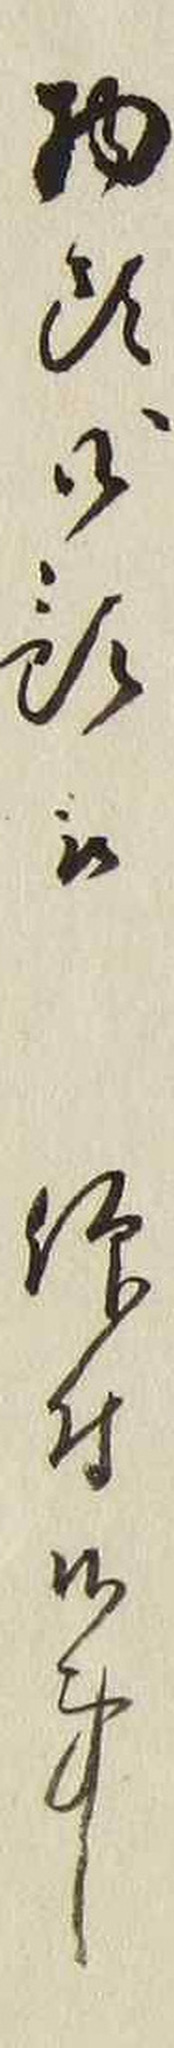物頭へ御預被仰付候事

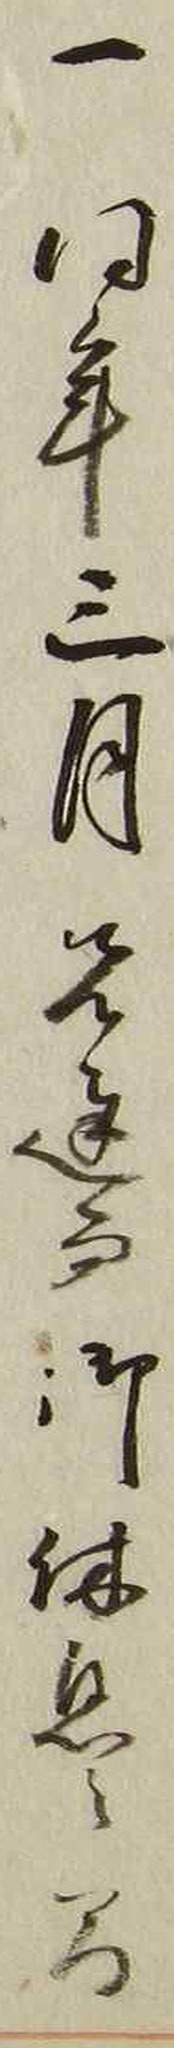一同年三月先達而御休息之間
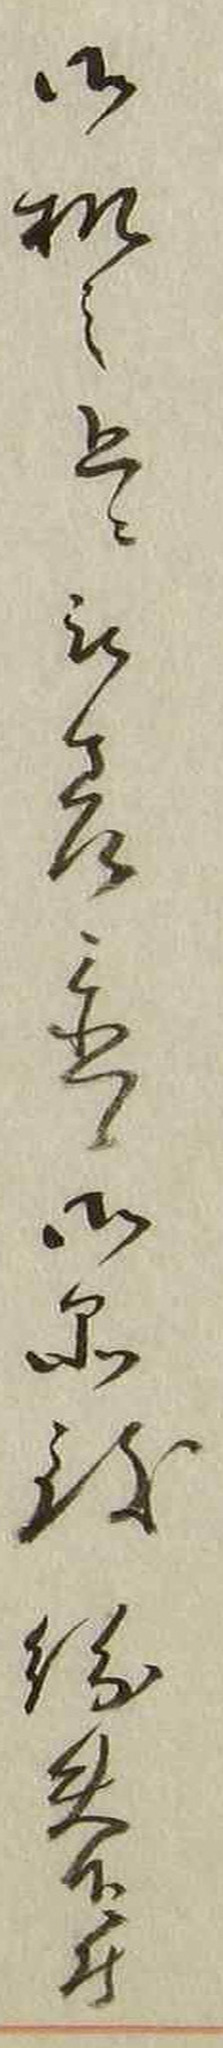御机之上に被差置候御品致紛失に付
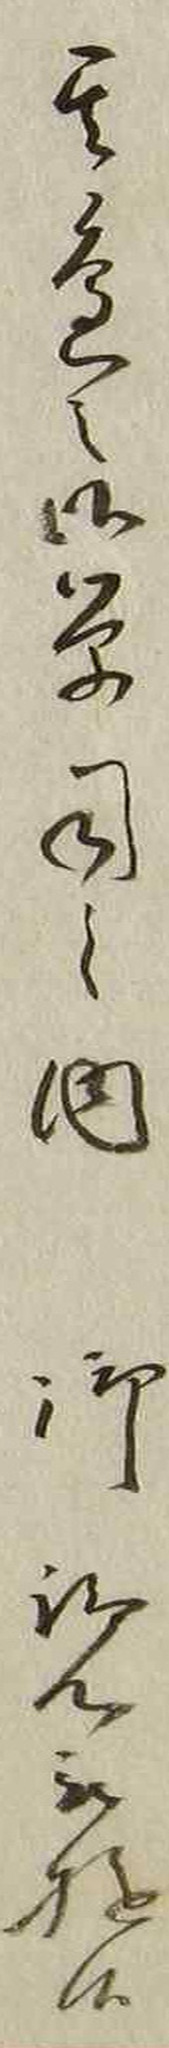其辺之御箪笥之内御覧被遊候
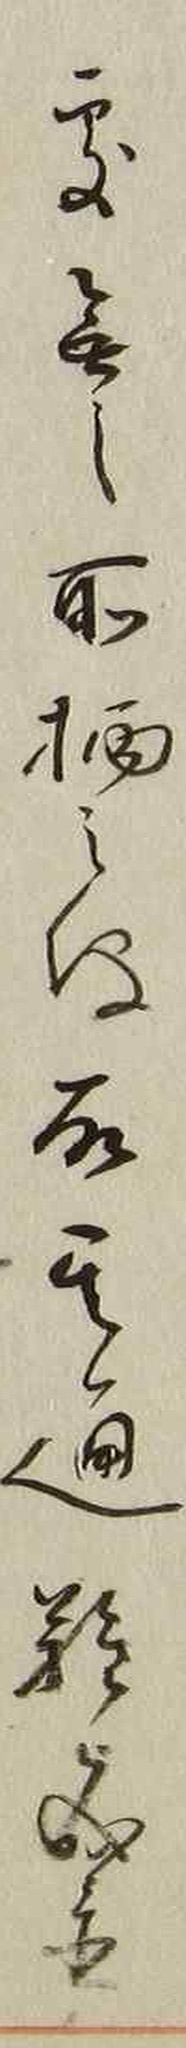処無之所柄之儀故其通難被成置
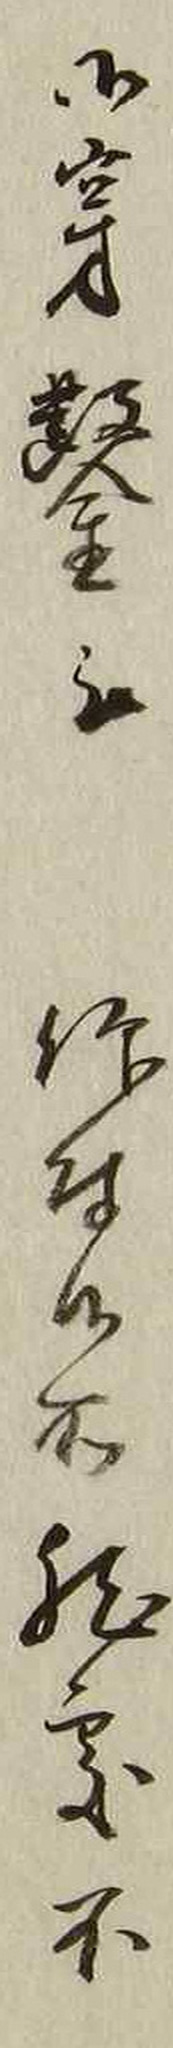御穿鑿被仰付候所然処不
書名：諸士系譜　巻之159　な之部1
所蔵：会津若松市立会津図書館
